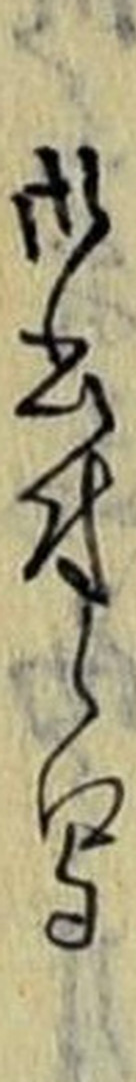御書付之写
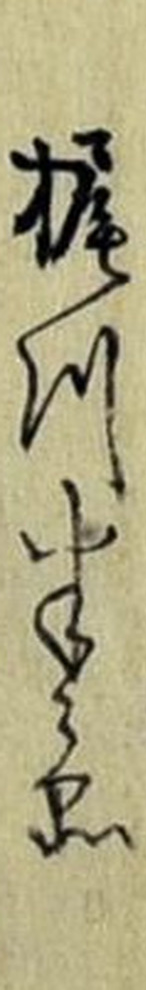梶川半兵衛
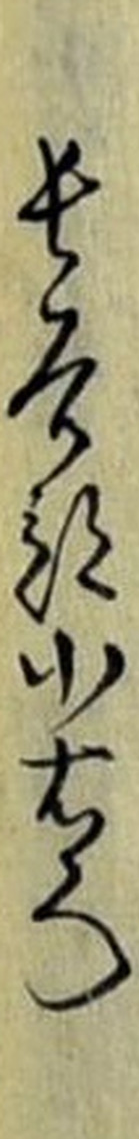長谷部小右衛門
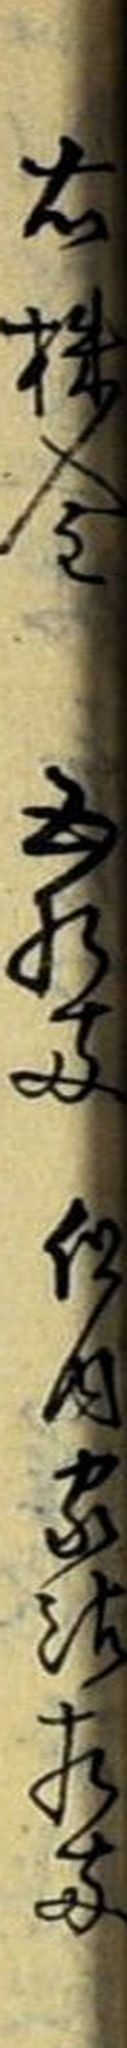右株金五拾両但内家銀拾両
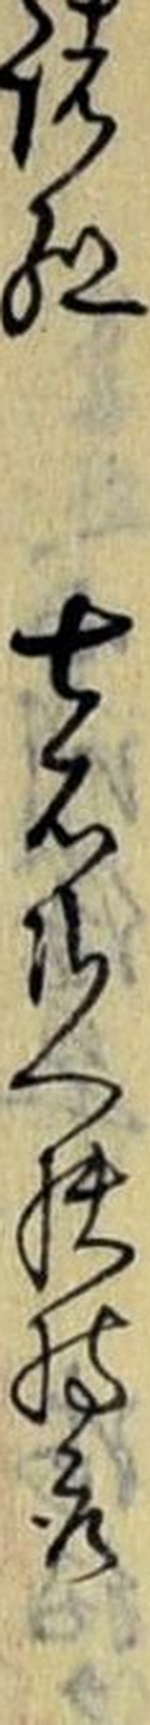諸組七石弐人扶持取
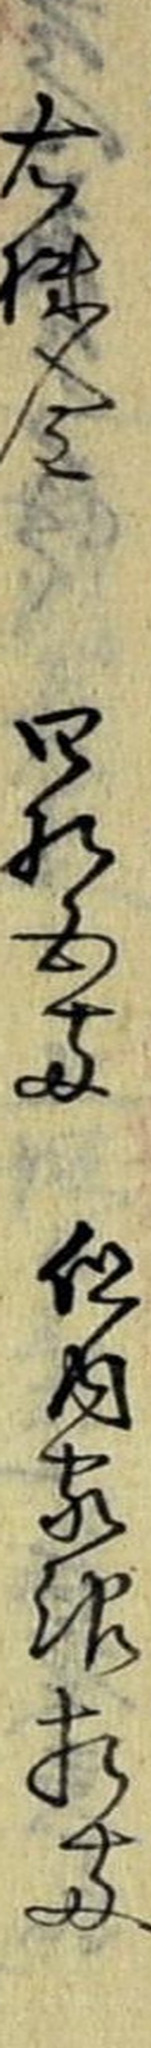右株金四拾五両但内家銀拾両
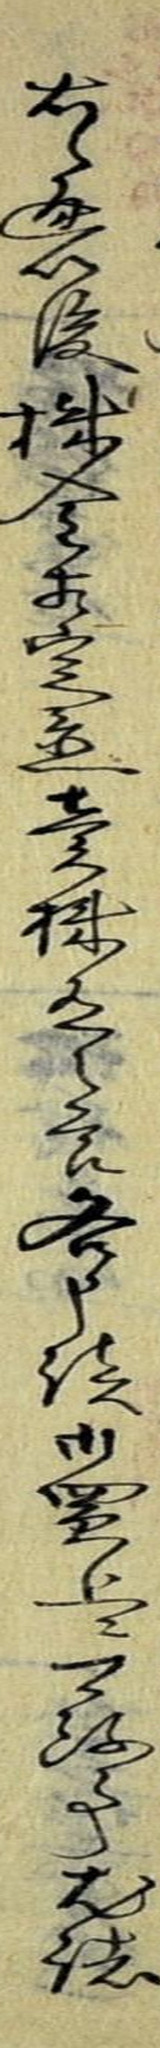右之通以後株金相定置売株有之節は各申談御買上に可致事尤諸
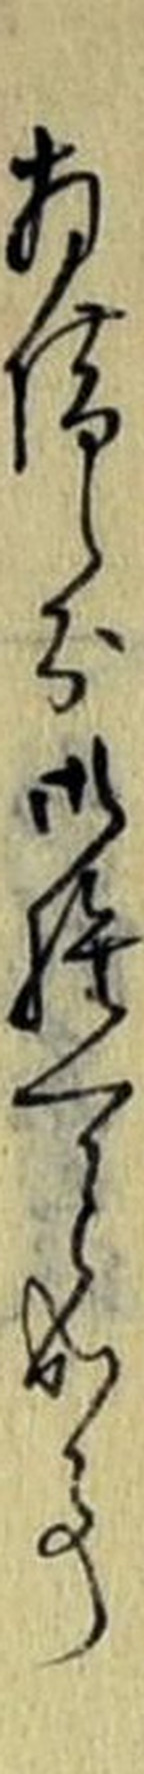拝借之分御捨可被成事〆
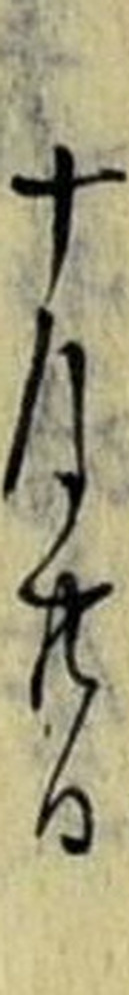十月廿日
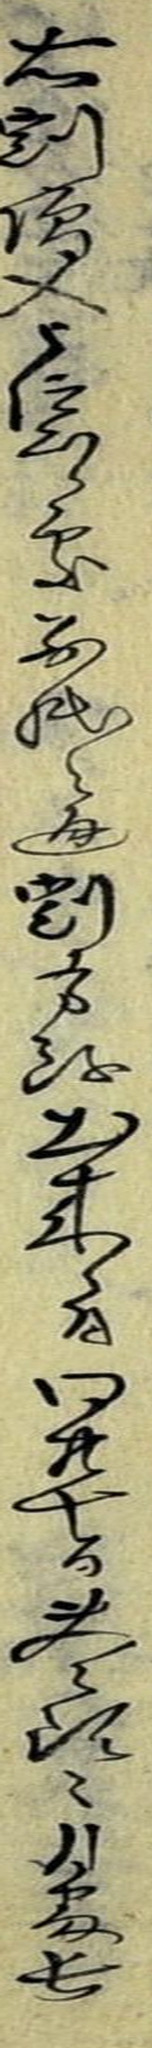右割増入被仰出候処別紙之通割方致出来候付同廿七日夫々頭々月番長
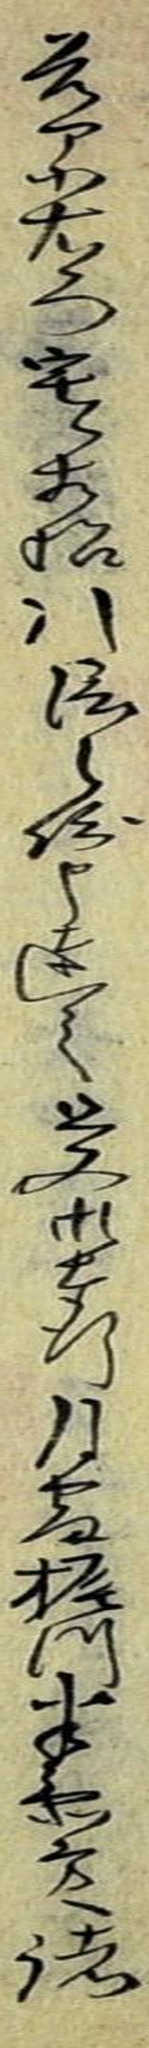谷部小右衛門宅へ相招引渡之儀申達之且又御奉行月番梶川半兵衛方へ諸
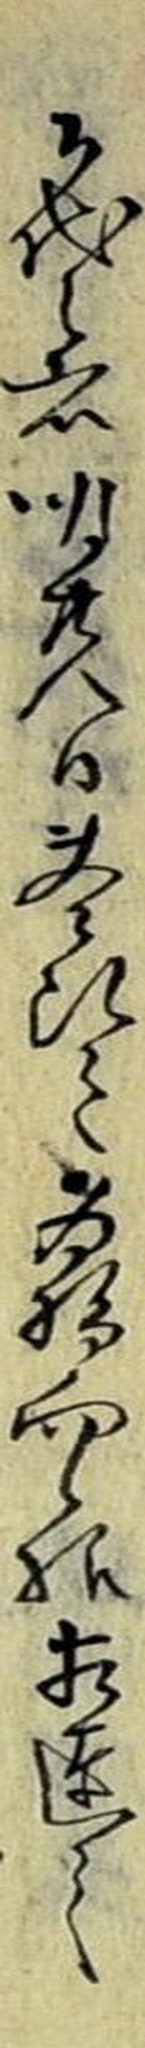下代之者明廿八日夫々頭々へ為指向候様相達之
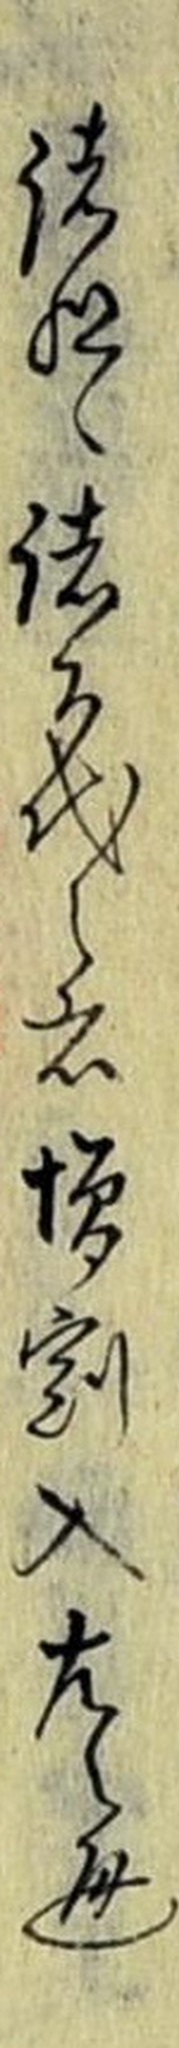諸組へ諸下代之者増割入左之通
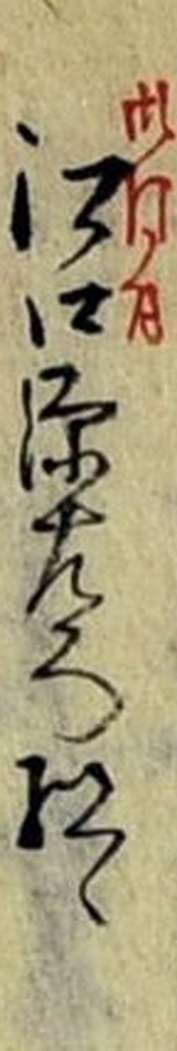鈴木十左衛門組へ
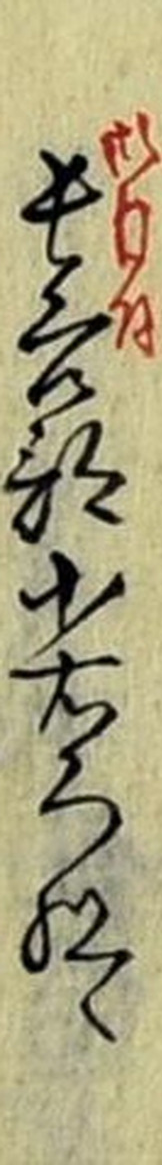長谷部小右衛門組へ
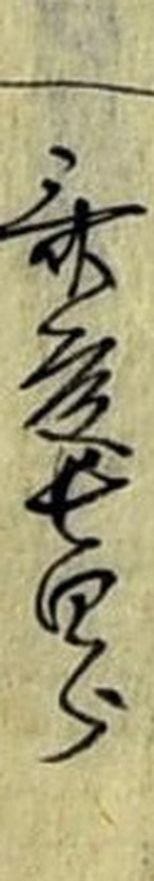々斉藤長四郎
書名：命令之部 四
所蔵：福井県文書館 Fukui Prefectural Archives
